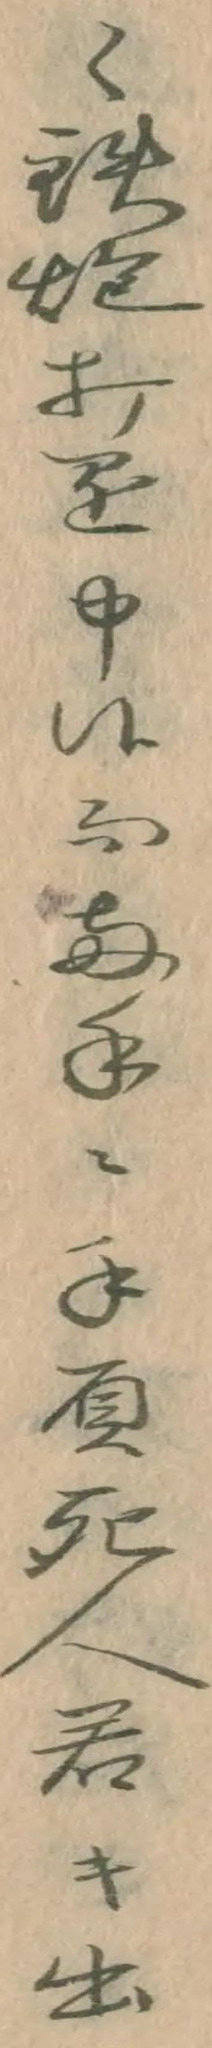く鉄炮打懸申候而両手に手負死人若き出

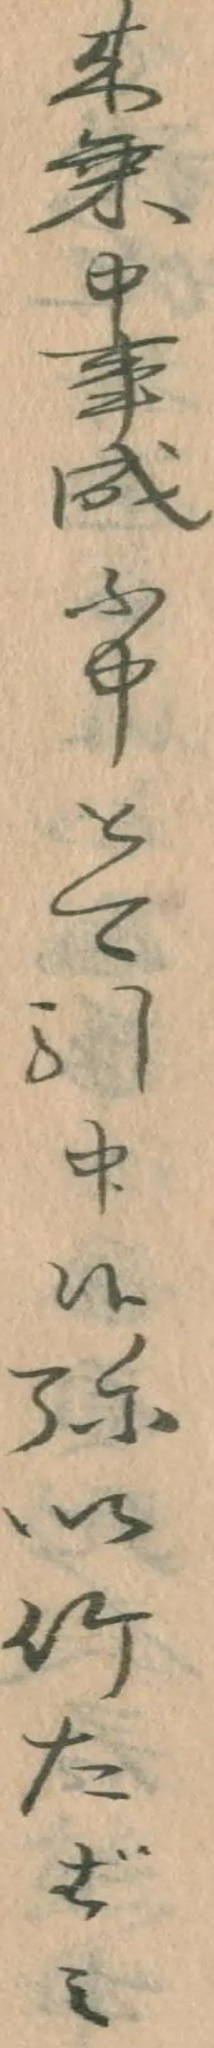来乗申事成ふ申とて引申候弥以竹たば之
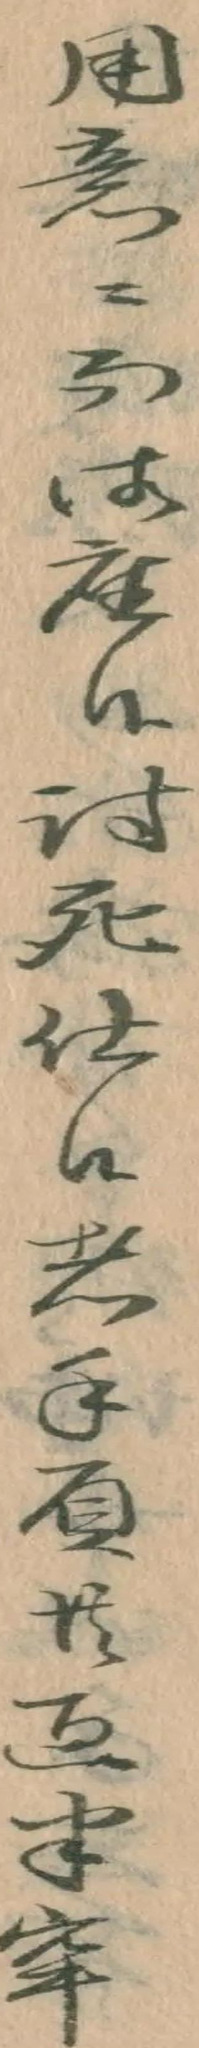用意に而御座候討死仕候者手負共過半牢
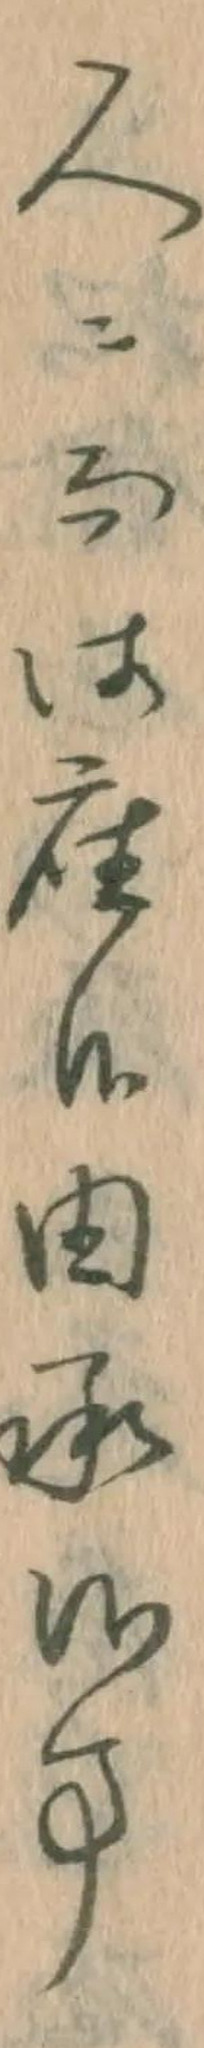人に而御座候由承候事
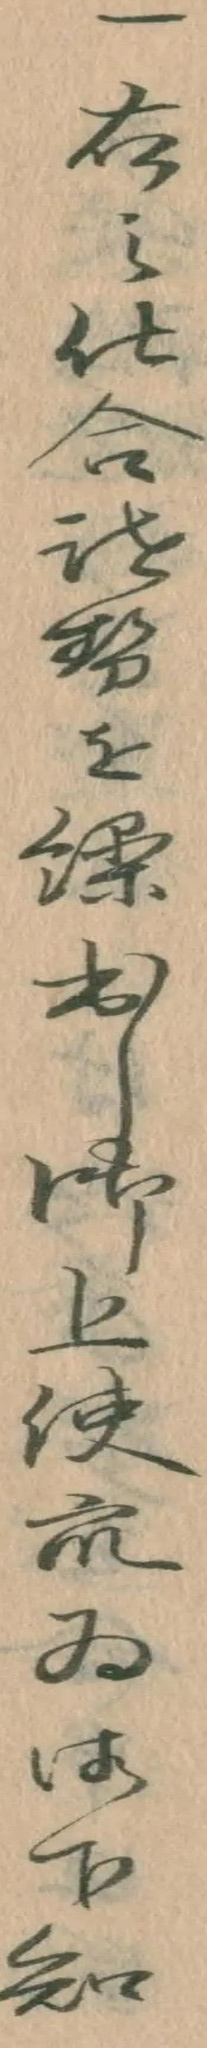一右之仕合諸勢を繰出し御上使衆ゐ御下知
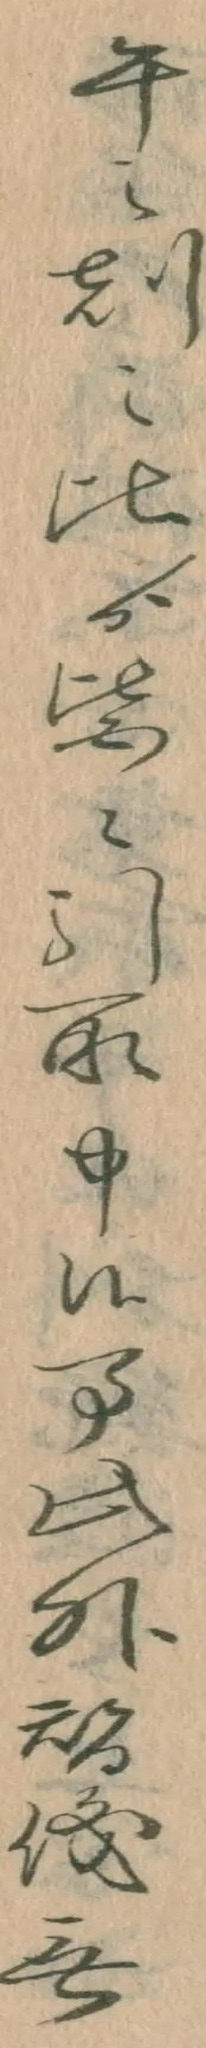午之刻之比ゟ皆々引取申候事此外替儀無
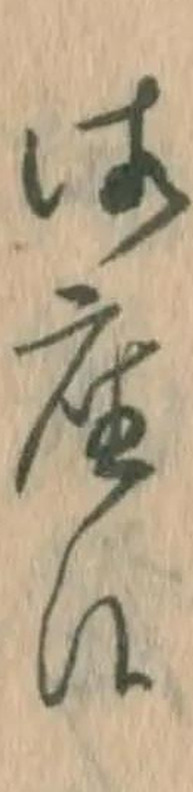御座候
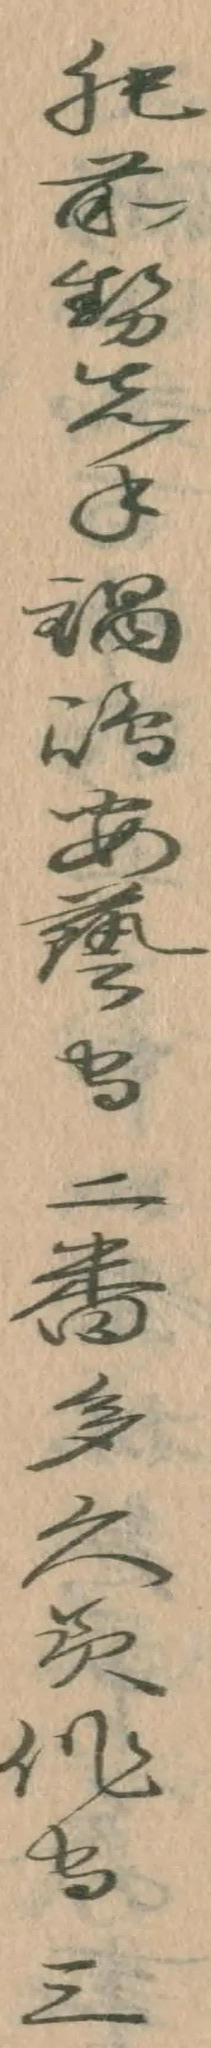一肥前勢先手鍋島安芸守二番多久美作守三
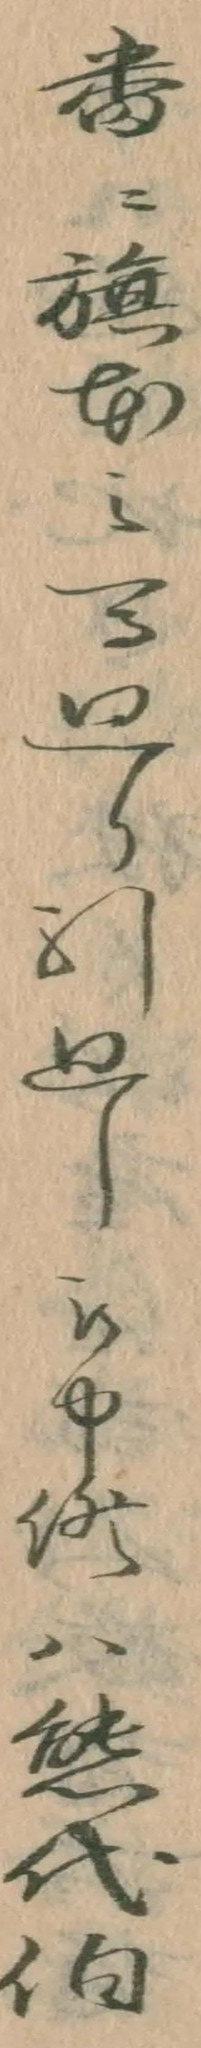番に籏本之馬廻り引廻し被申候は熊代伯
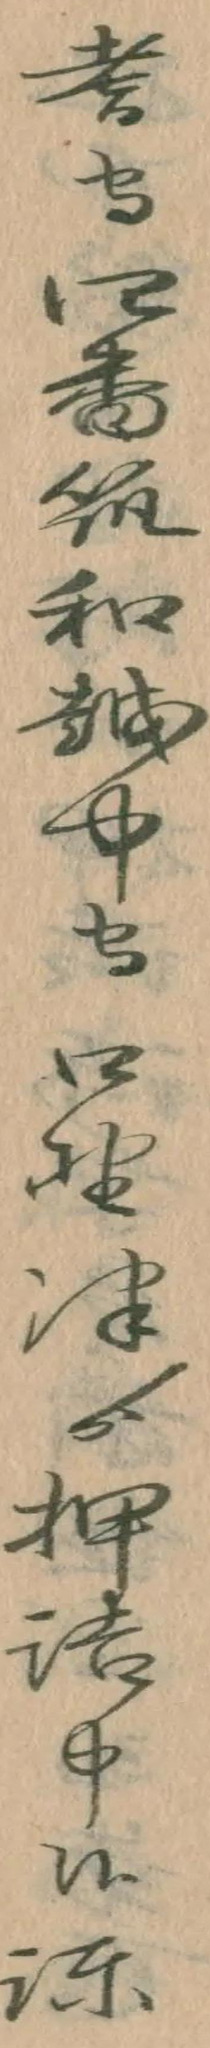耆守四番筑和越中守口野津ゟ押詰申候諌
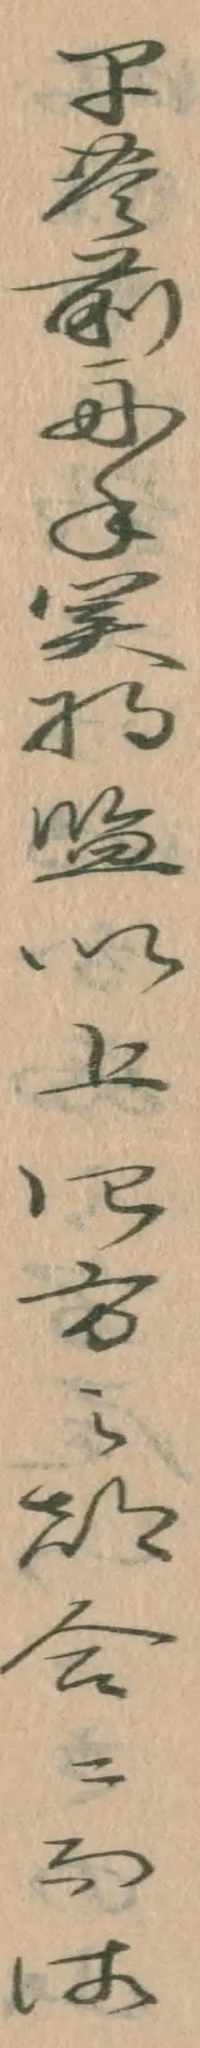早豊前舟手関将監以上四方之都合に而御
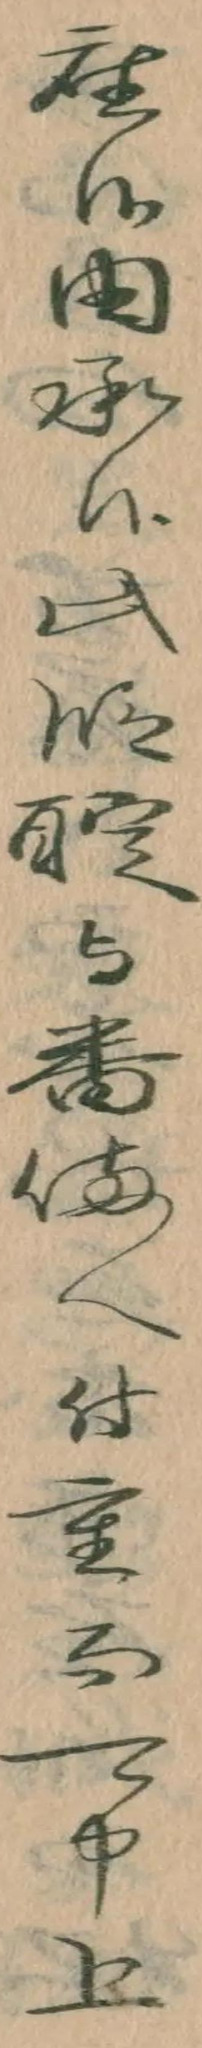座候由承候此段聢与番備へ付重而可申上
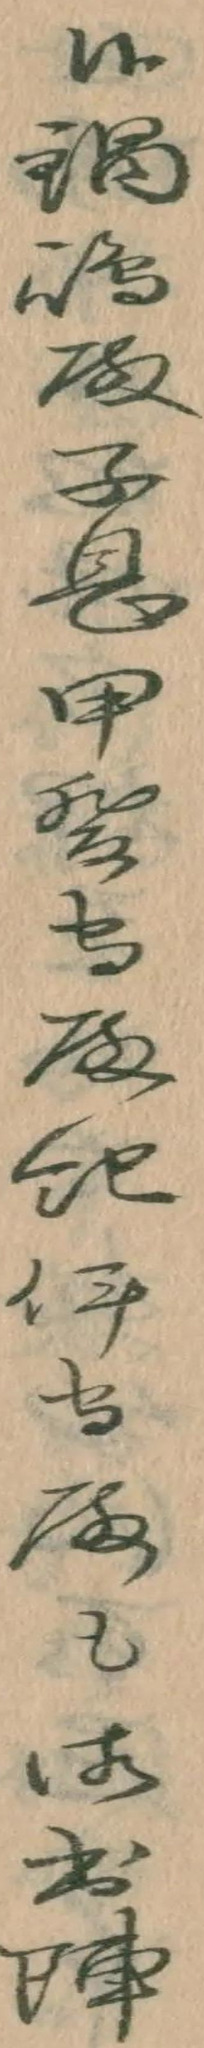候鍋島殿子息甲斐守殿紀伊守殿も御出陣
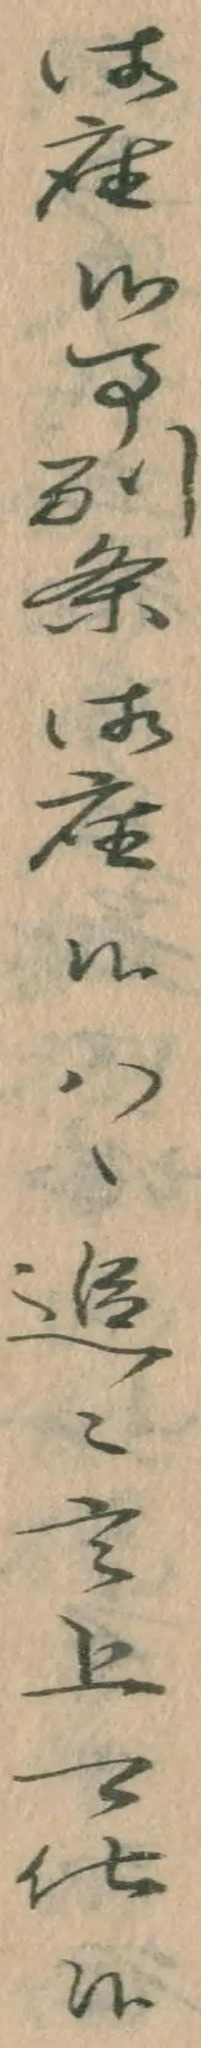御座候事別条御座候はゝ追々言上可仕候
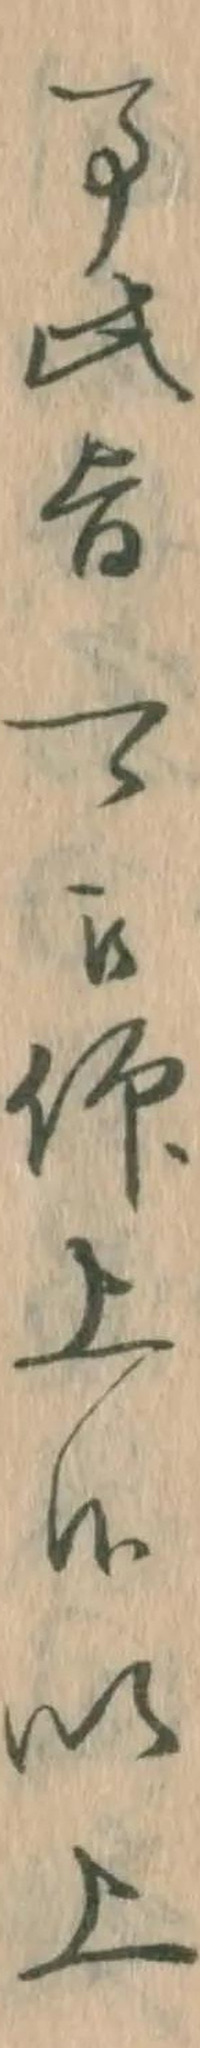事此旨可被仰上候以上
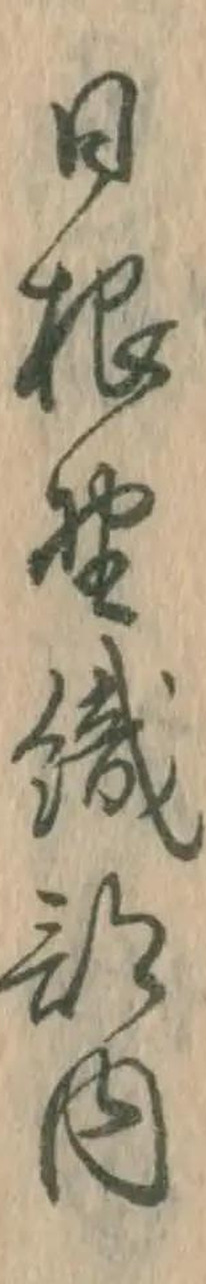日根野織部内
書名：切支丹御退治記 49巻. [4]
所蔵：国立国会図書館 National Diet Library, JAPAN
